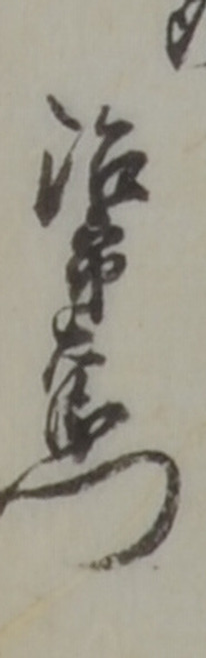治良右衛門
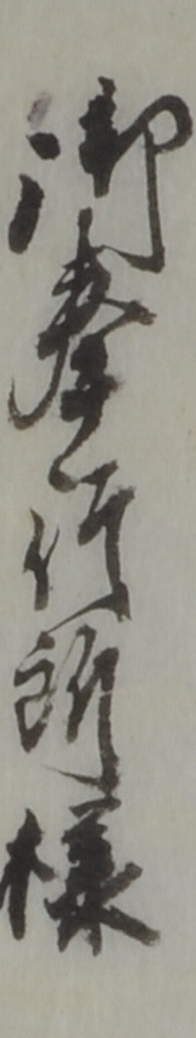御奉行所様
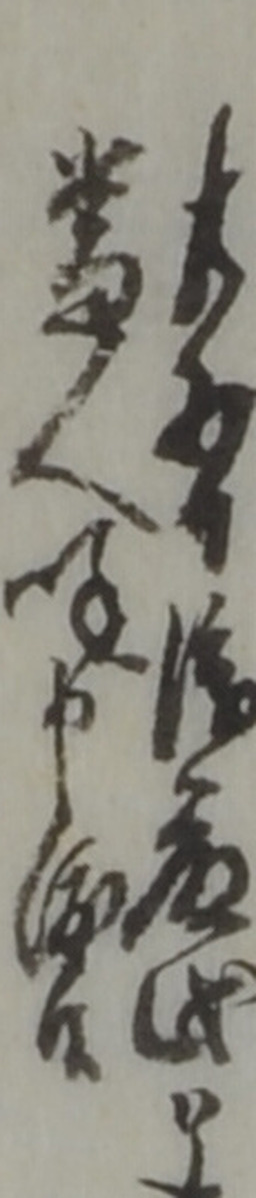当人呼申渡候
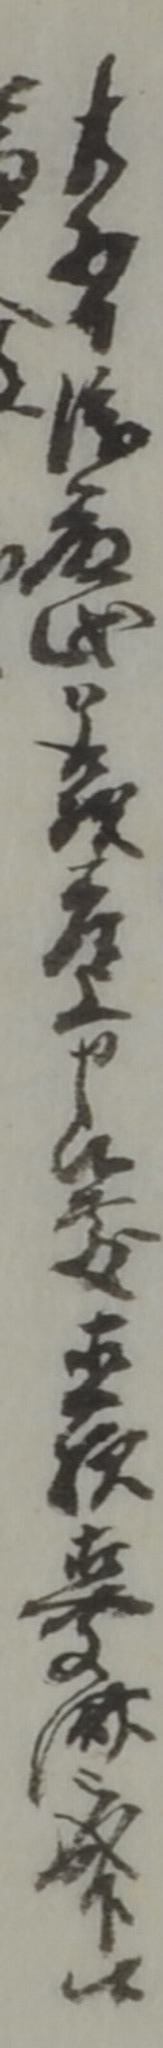廿五日後藤氏御取次差上申候處直様御聞済被成下候
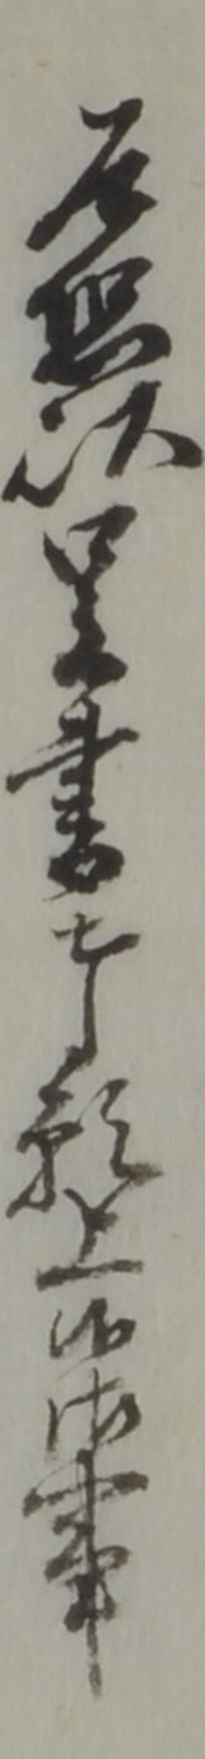乍恐以口上書奉願上候御事
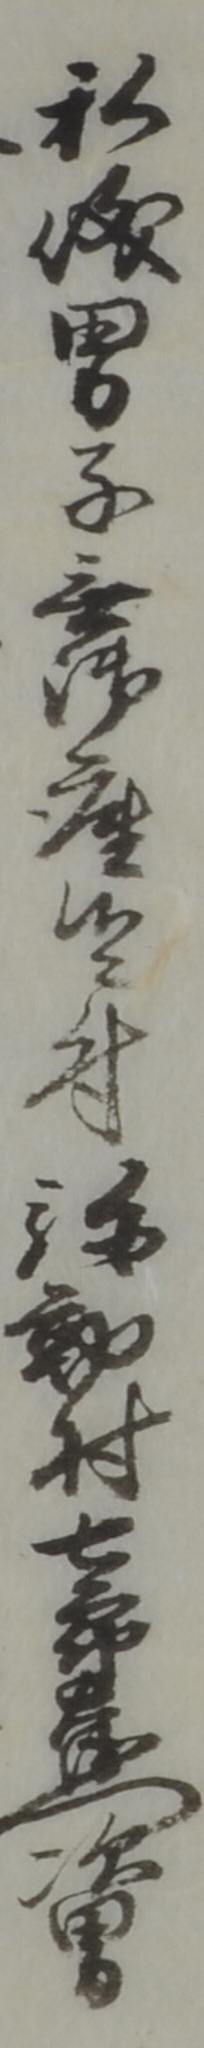私儀男子無御座候ニ付弥勒村七郎右衛門次男
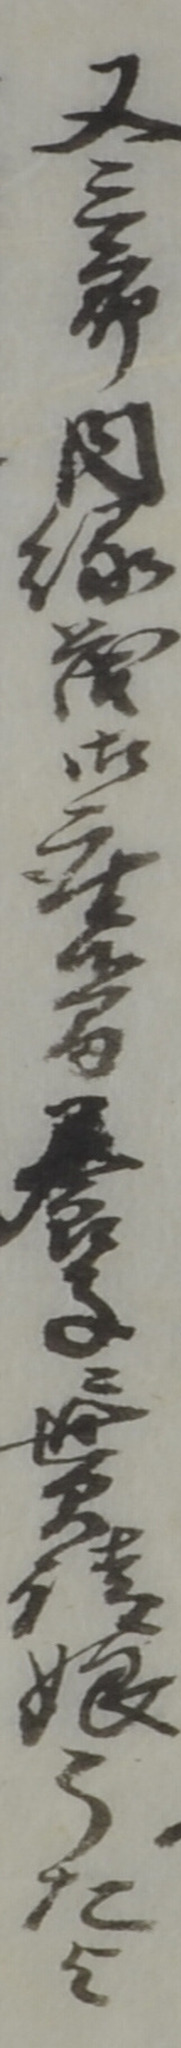又三郎内縁も御座候間養子ニ貰請娘うたと
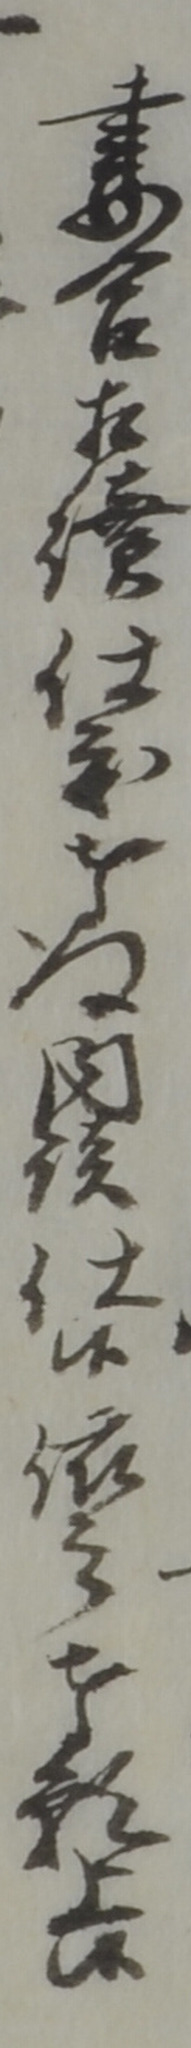妻合相續仕度奉存内談仕候依之奉願上候
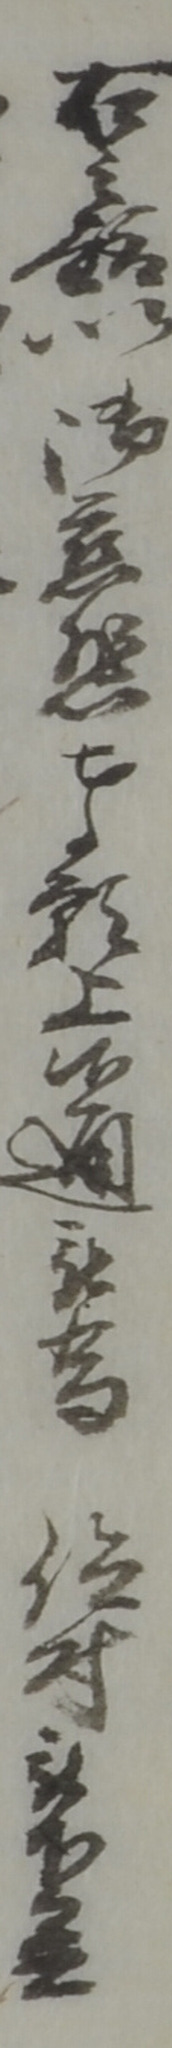右之趣以御慈悲奉願上候通被為仰付被下置
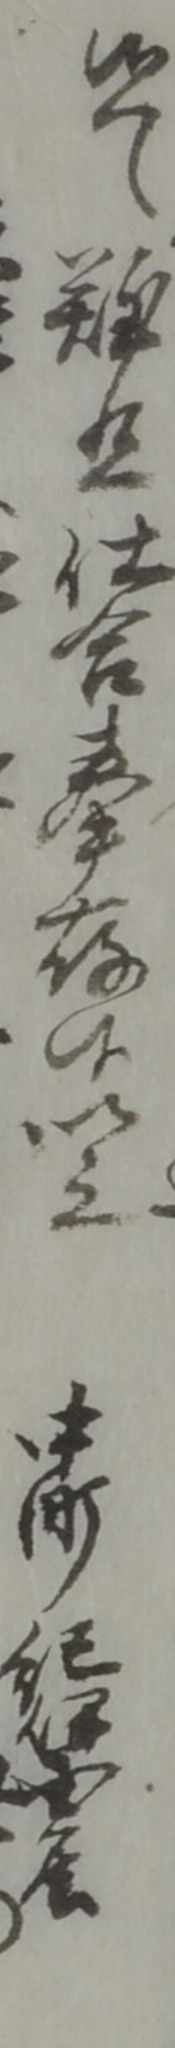候ハヽ難有仕合奉存候以上中町紀伊国屋
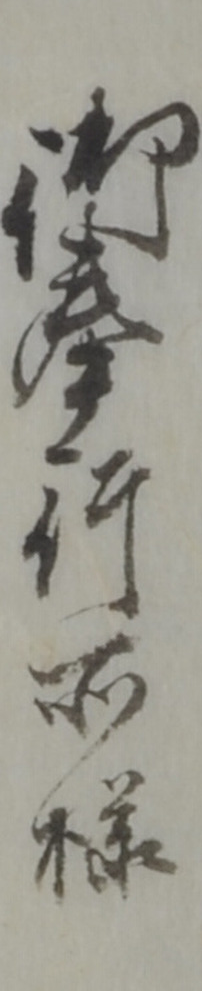御奉行所様

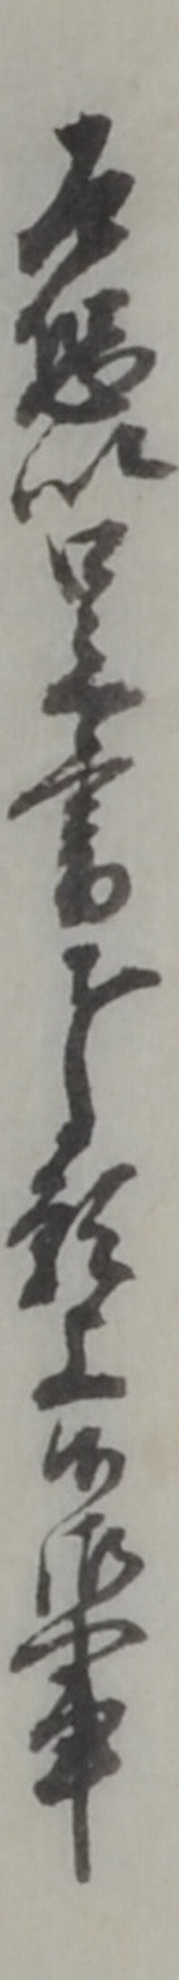乍恐以口上書奉願上候御事
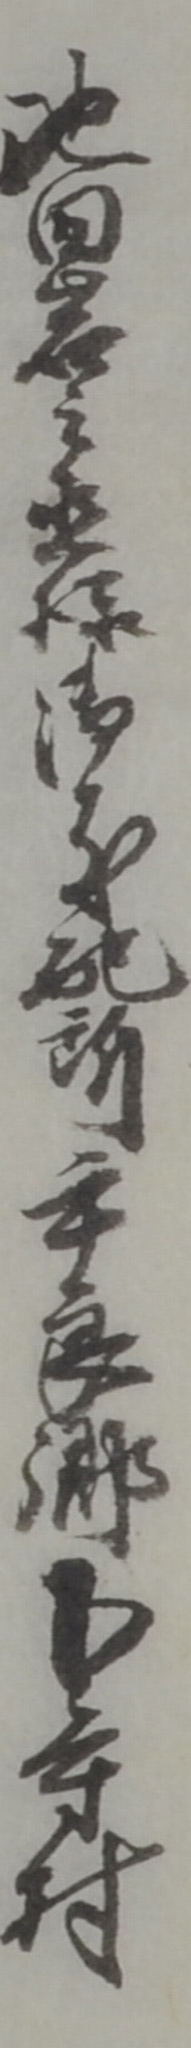池田岩之丞様御支配所平良郷下寺村
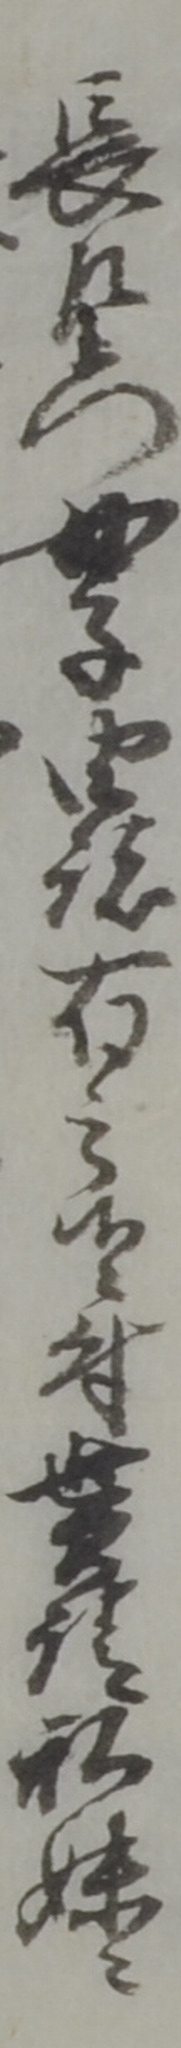長左衛門女子由緒有之候ニ付貰請私妹ニ
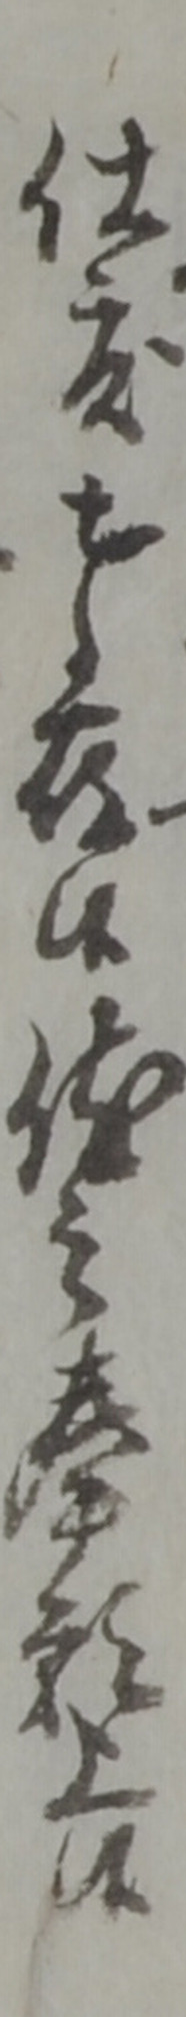仕度奉在候依之奉願上候
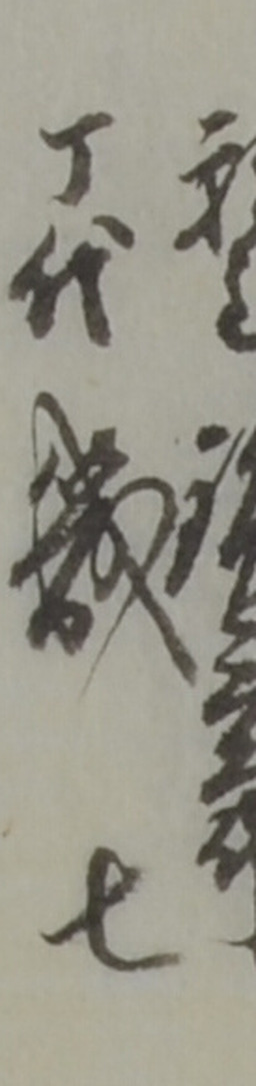丁代幾七
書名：諸願書控簿
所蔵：伊那市立高遠町図書館・合同会社AMANE
